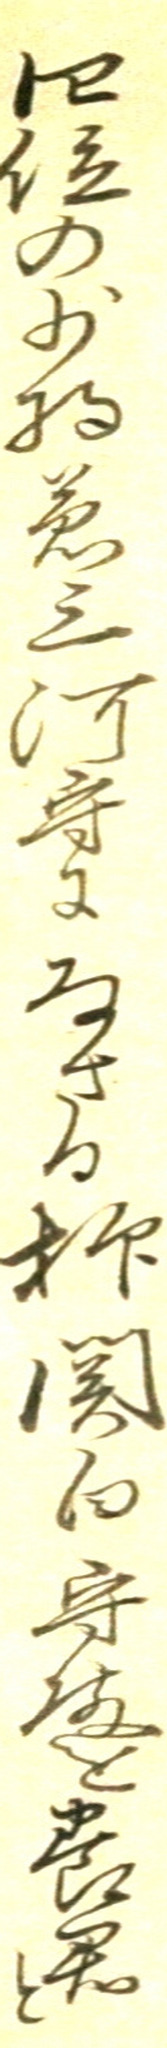四位の少将兼三河守になさる抑関白守殿を養君と
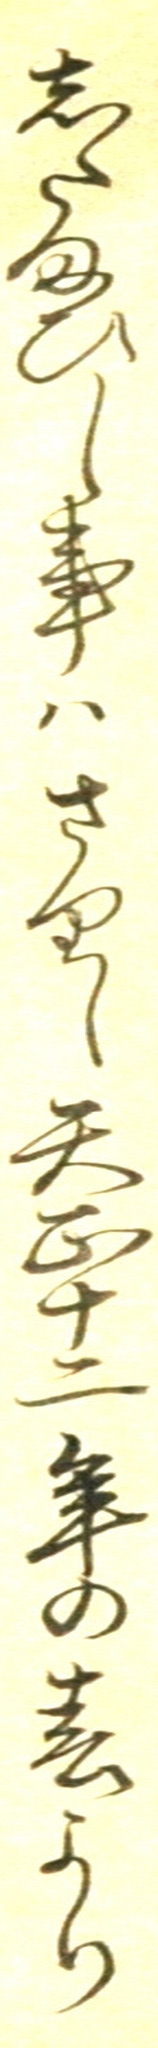したまひし事はさりし天正十二年の春より
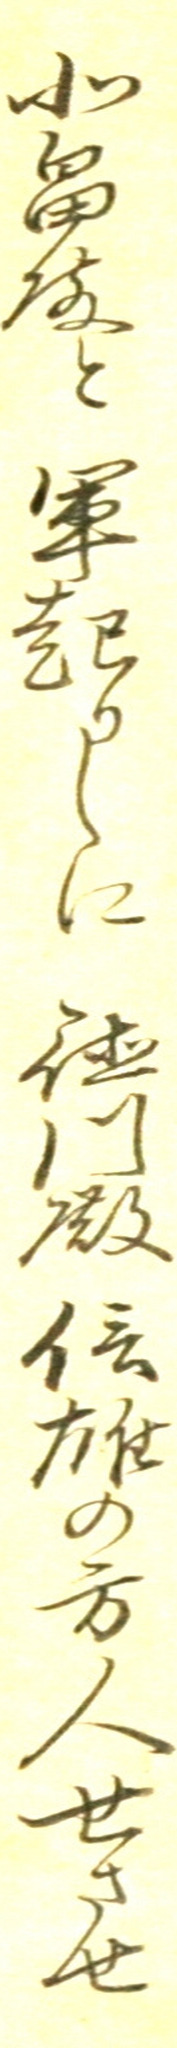北畠殿と軍起りしに徳川殿信雄の方人せさせ

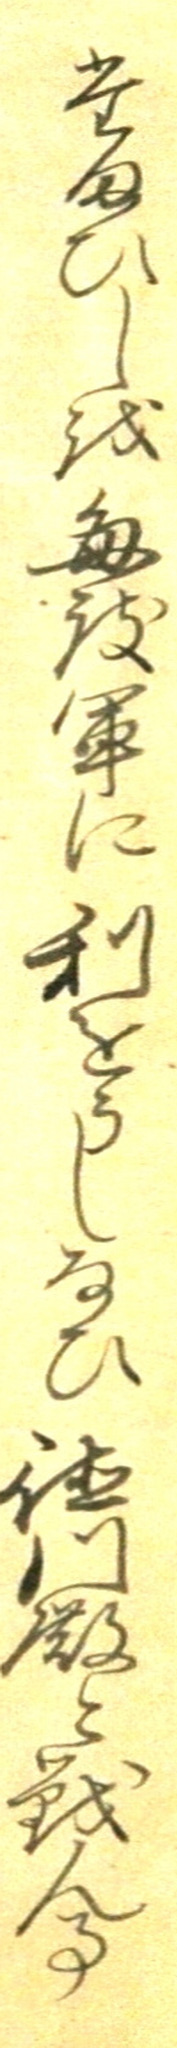たまひしを毎度軍に利をうしなひ徳川殿と戦ん事
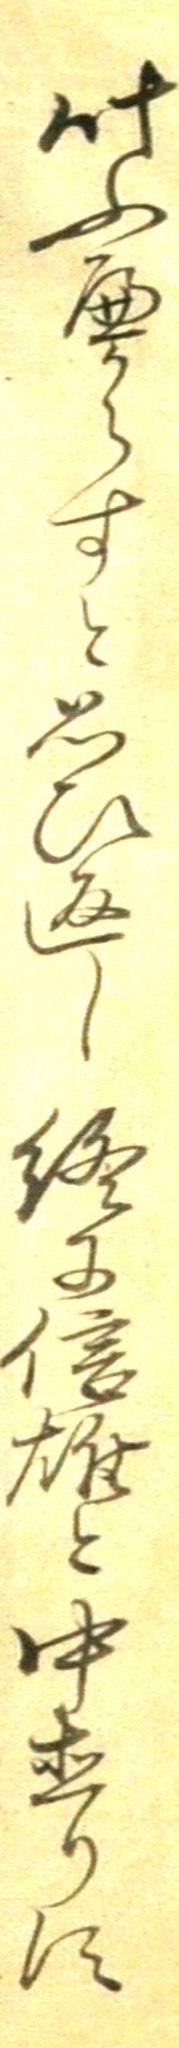叶ふへからすと思ひ返し終に信雄と中直りす
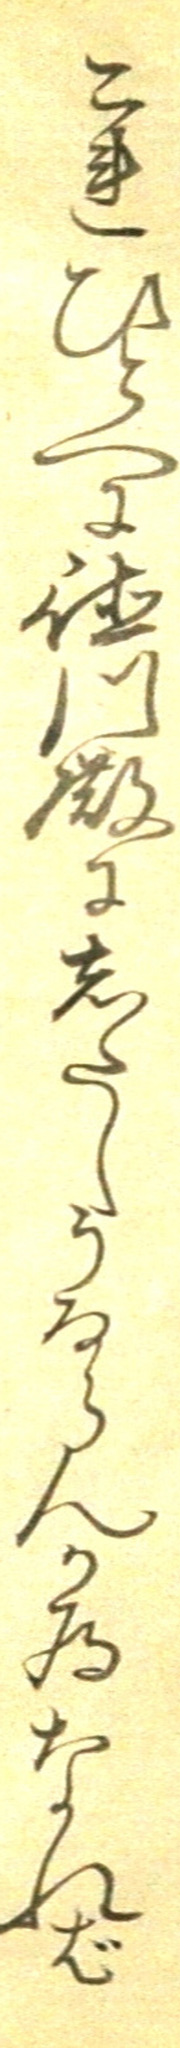これひとへに徳川殿にしたしうならんか為なれば
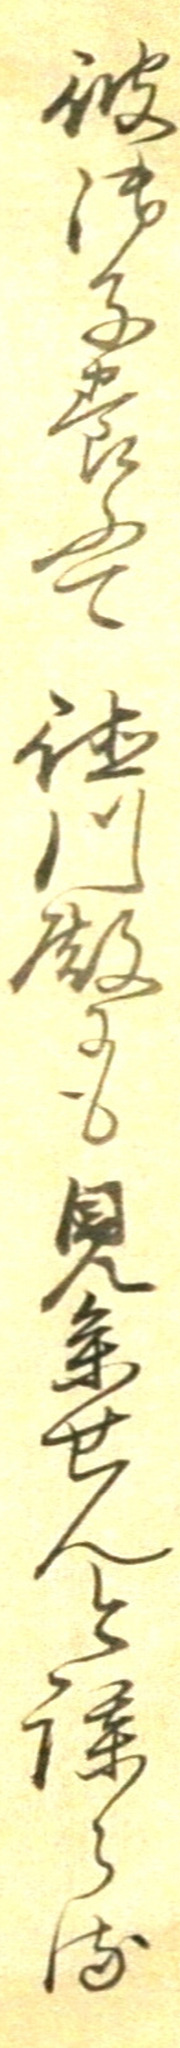彼御子養ふて徳川殿にも見参せんと謀らる
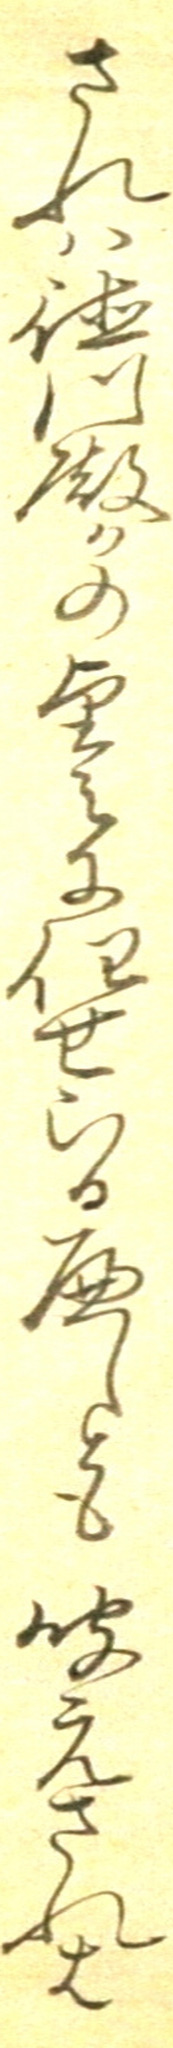されは徳川殿かの望みに任せらるへしとも聞えされは
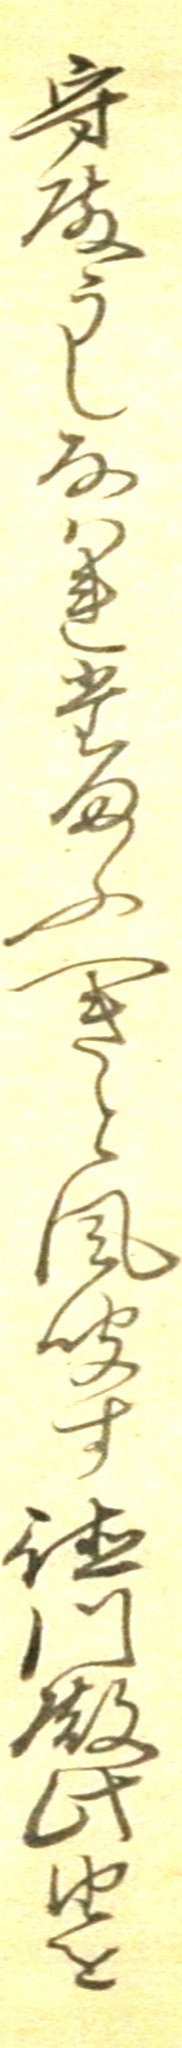守殿うしなはれたまふへきと風聞す徳川殿此由を
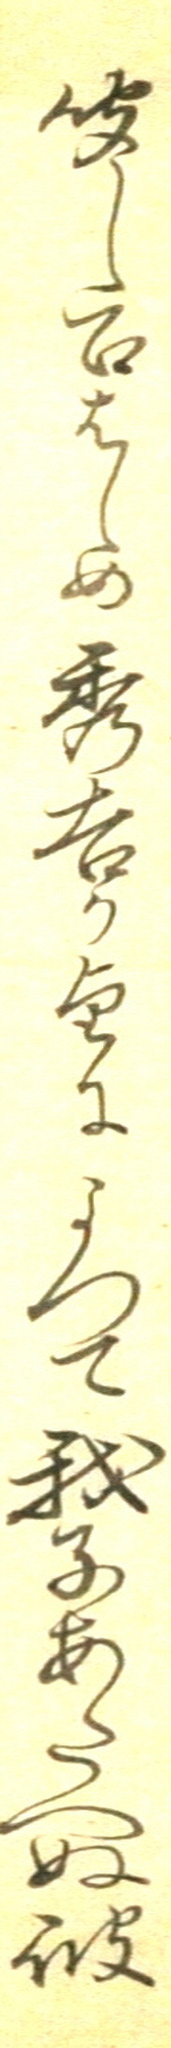聞し召はしめ秀吉か望によつて我子あたへぬ彼
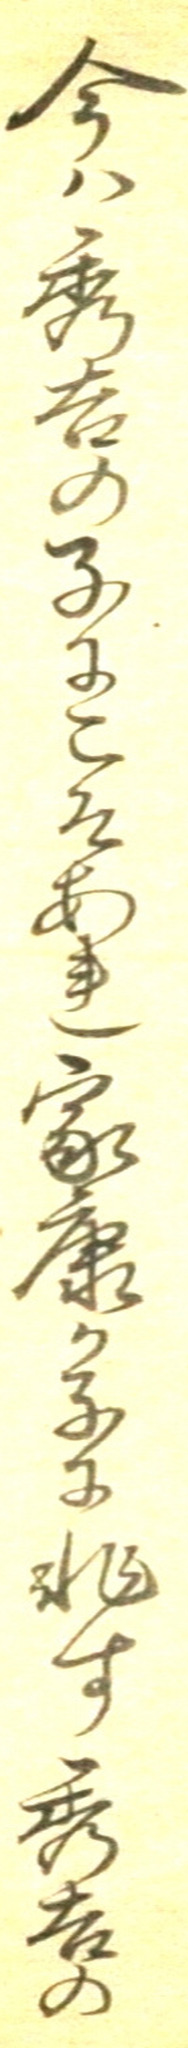今は秀吉の子にこそあれ家康か子に非す秀吉の
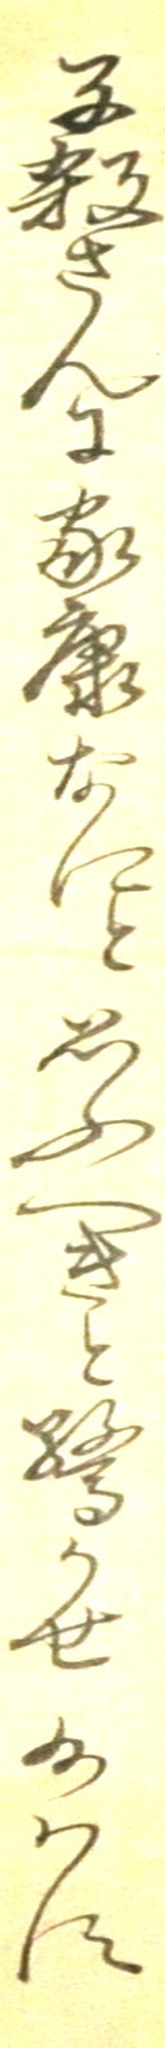子殺さんに家康なにと思ふへきと驚かせ給はす
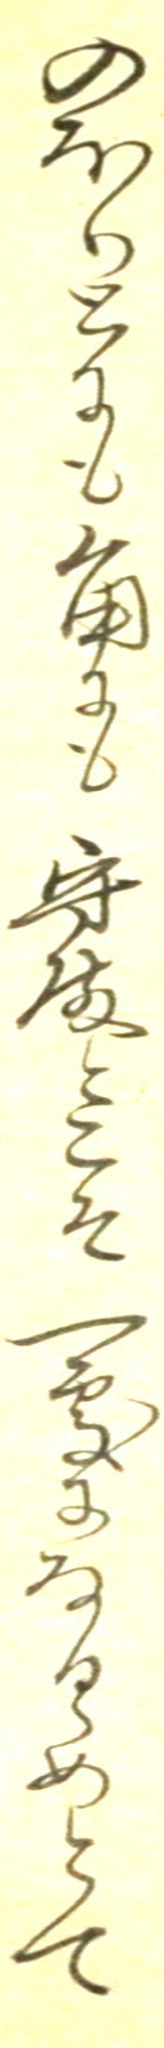のほりとにも角にも守殿とこそ一処になるらめとて
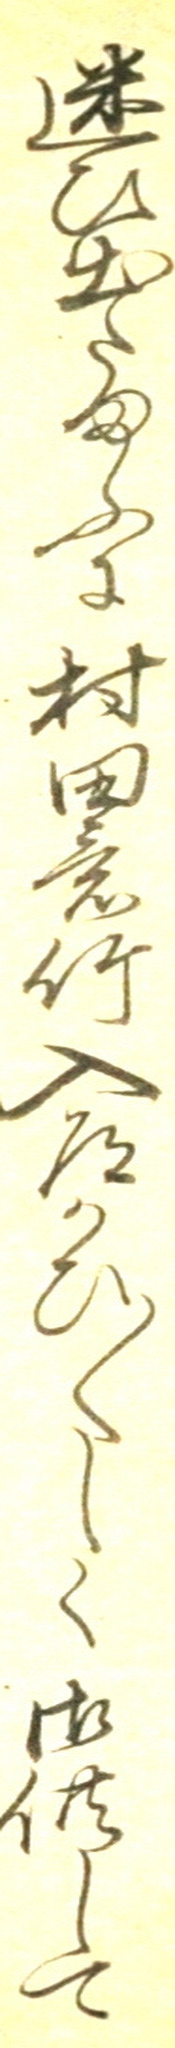迷ひ出たまふに村田意竹入道かひ〳〵しく御供して
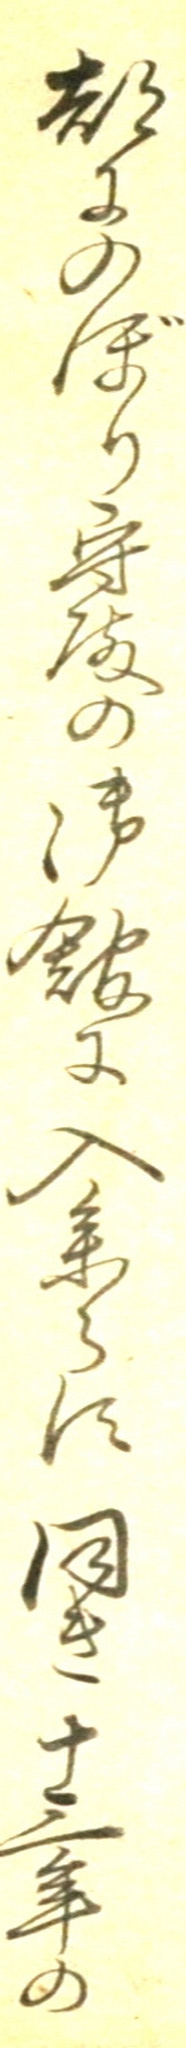都にのぼり守殿の御館に入参らす同き十三年の
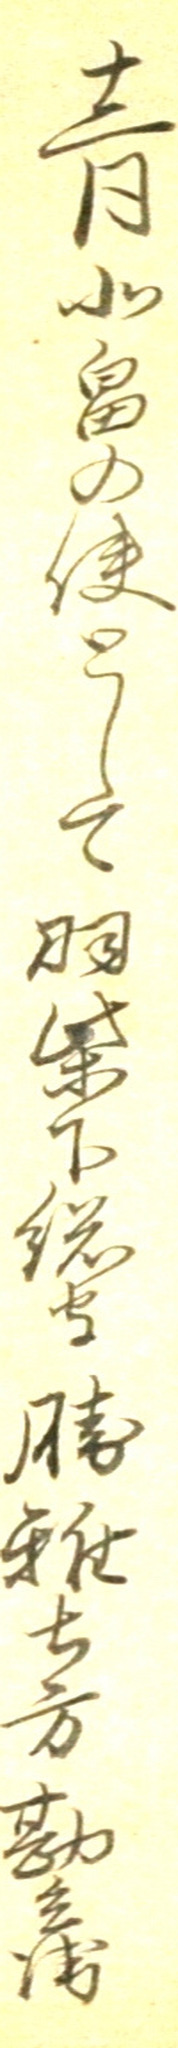十二月北畠の使として羽柴下総守勝雅土方勘兵衛
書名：藩翰譜（一）
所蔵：伊那市立高遠町図書館・合同会社AMANE
